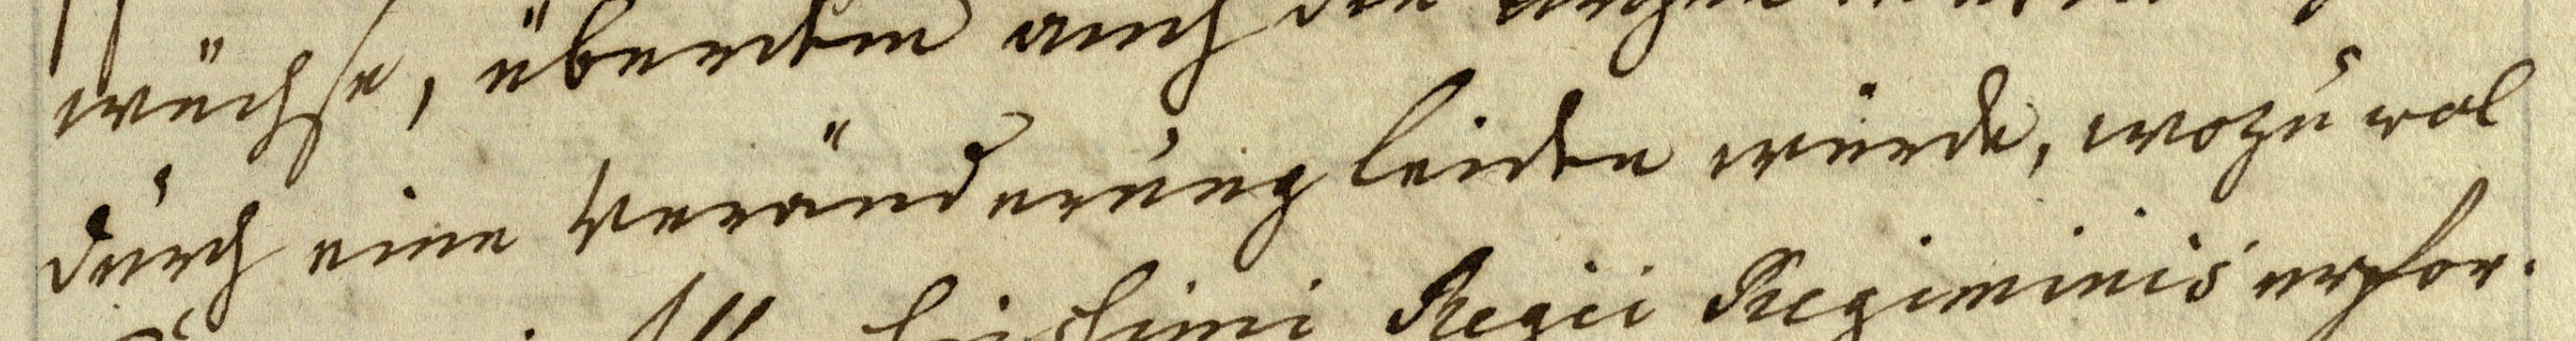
durch eine Veränderung leiden würde, wozu wol
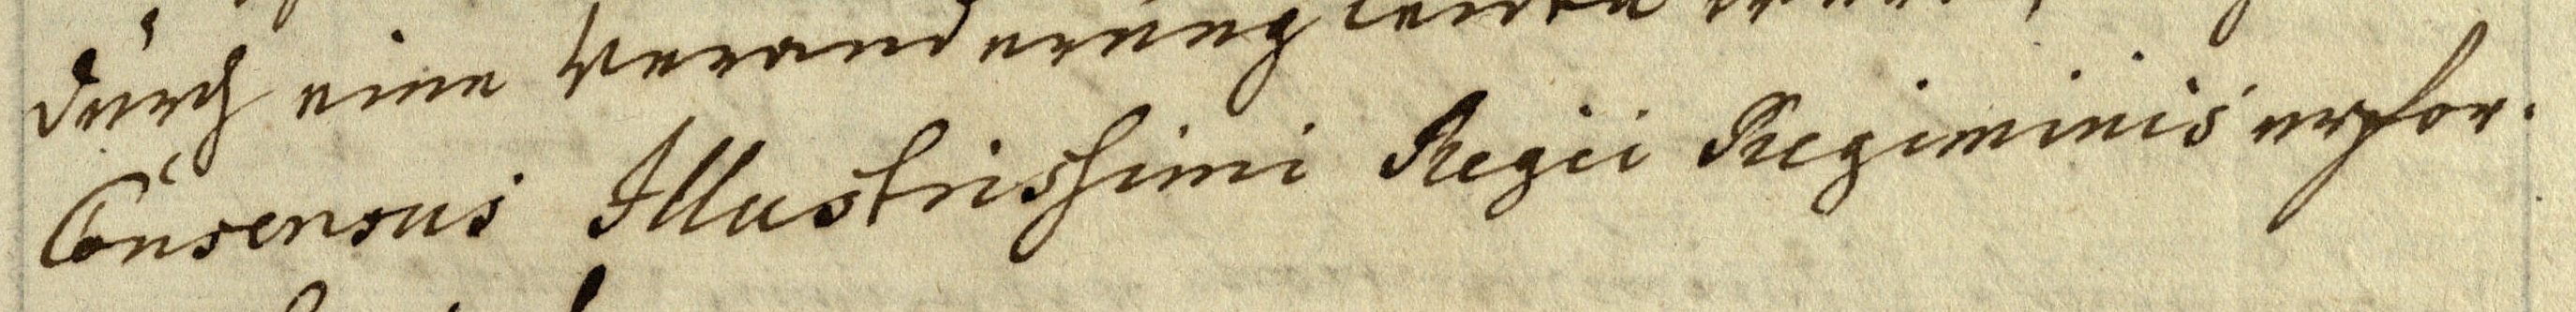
Consensus Illustrissimi Regii Regiminis erfor¬
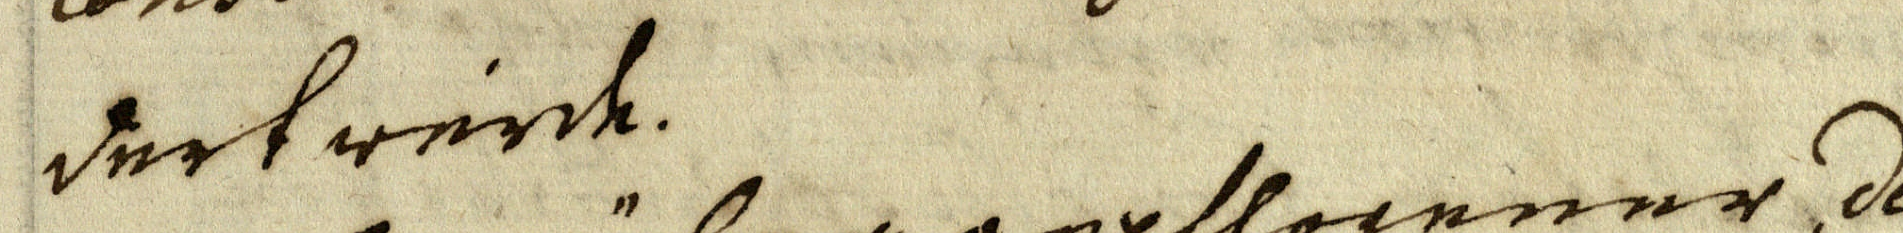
dert würde.
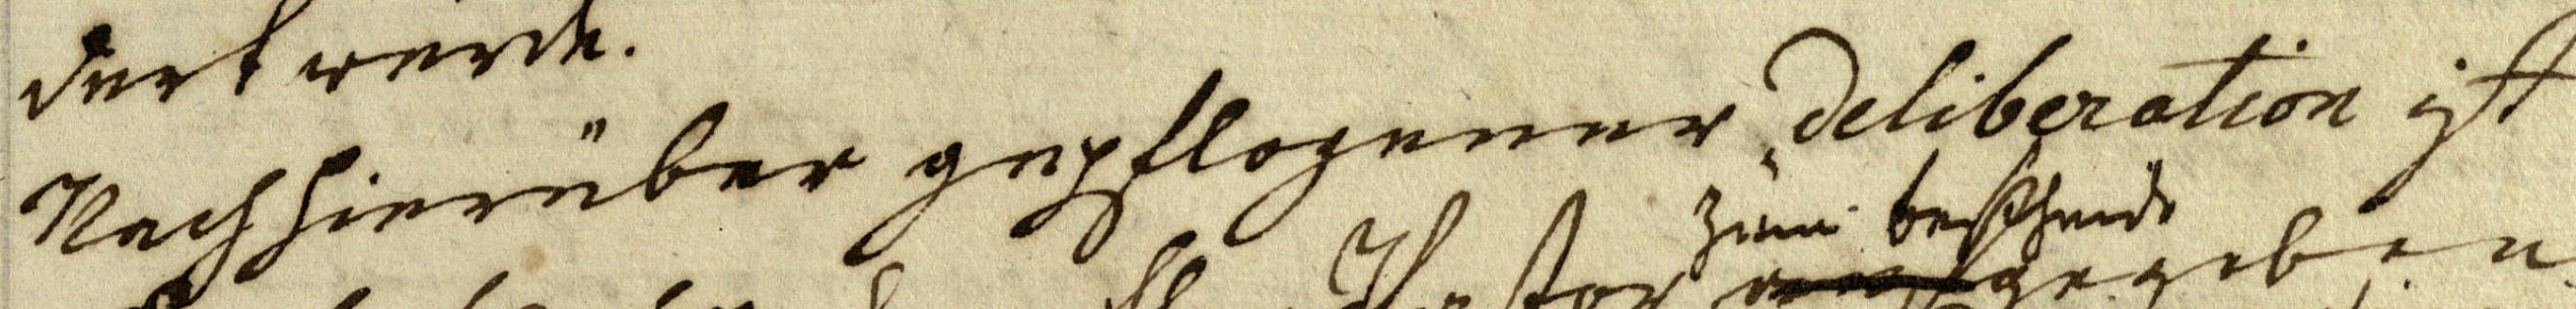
Nach hierüber gepflogener deliberation ist
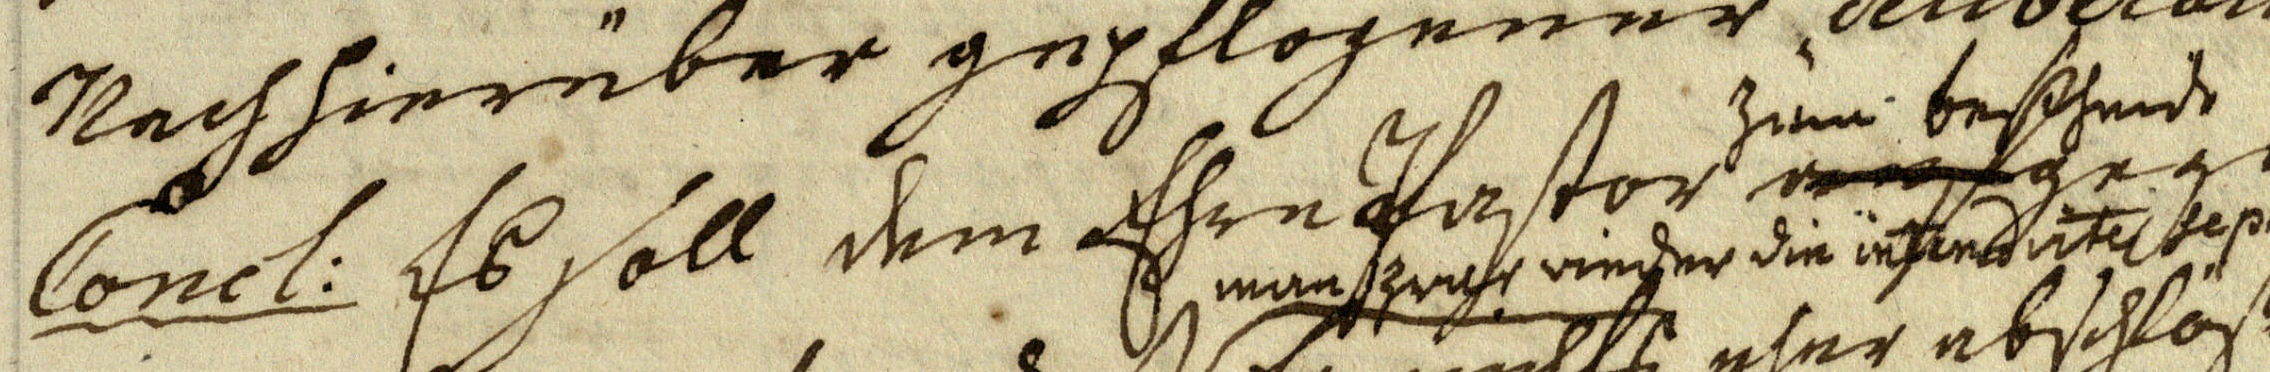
Concl. Es soll dem Herrn Pastor zum bescheide
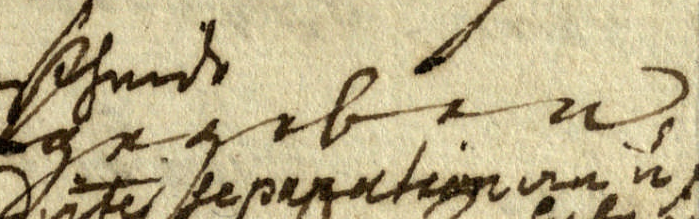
gegeben
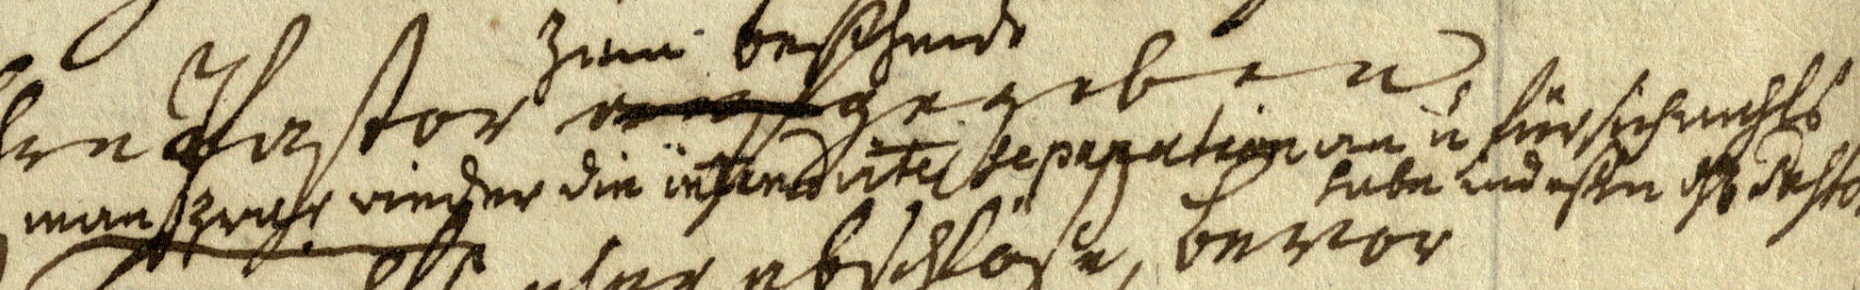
man zwahr wieder die intendirte separation an u für sich recht
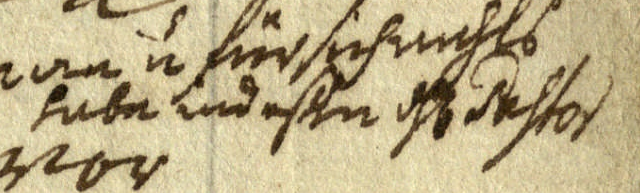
habe und es an dh Pastor
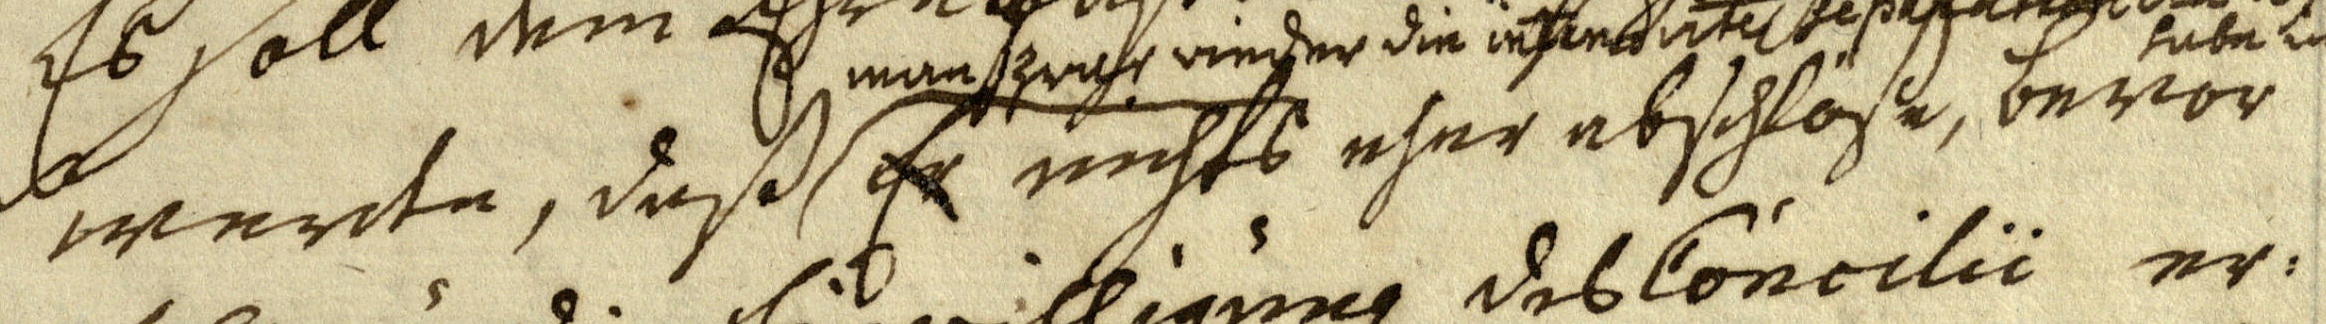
werden, daß nichts eher abschlöße, bevor
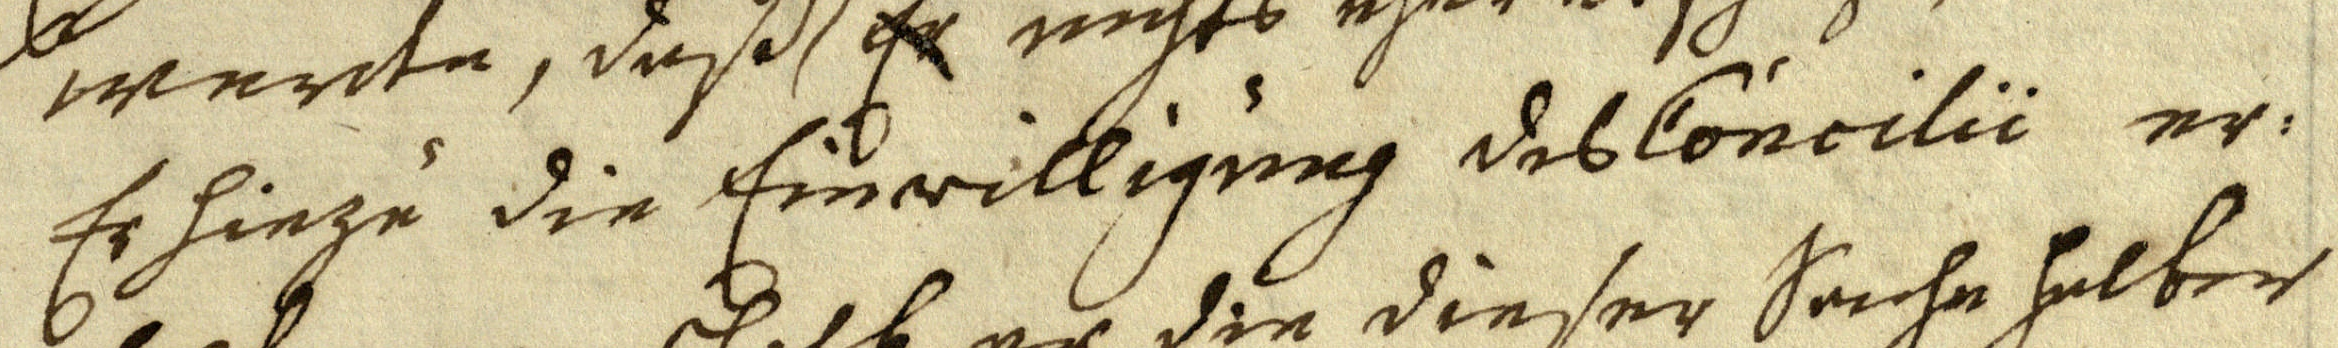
Er hiezu die Einwilligung des Concilii er¬
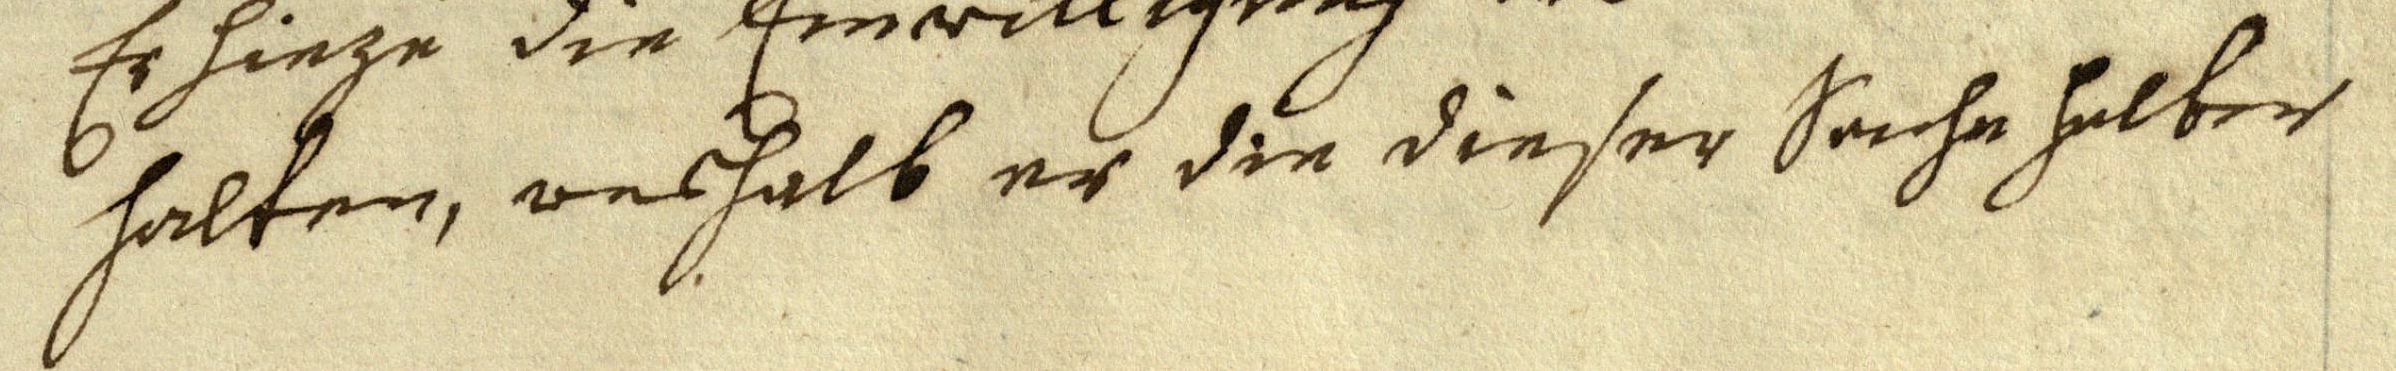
halten, weshalb er dieser Sache halber
